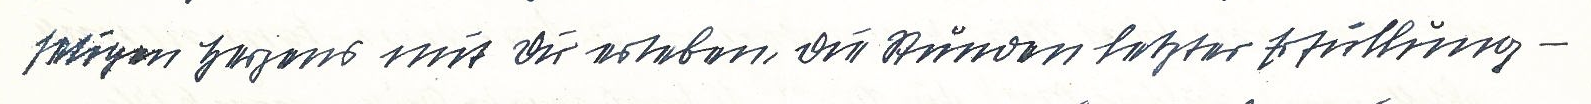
seligen Herzens mit Dir erleben, die Stunden letzter Erfüllung –
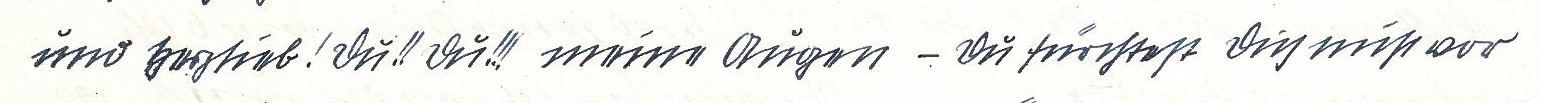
und Herzlieb! Du!! Du!!! meine Augen – Du fürchtest Dich nicht vor
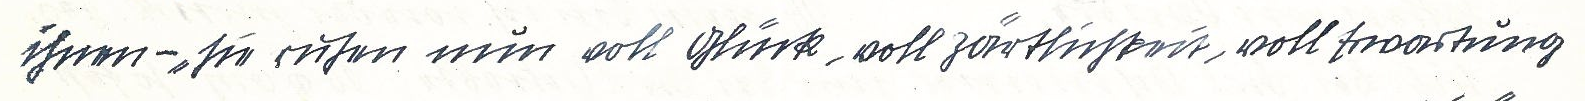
ihnen – „sie ruhen nun voll Glück, voll Zärtlichkeit, voll Erwartung
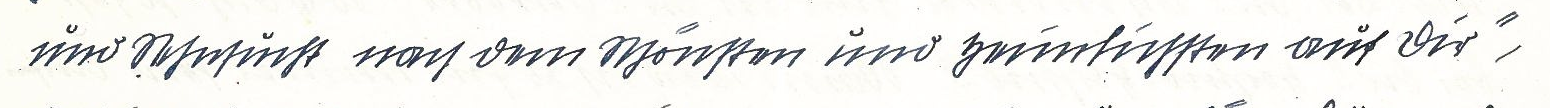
und Sehnsucht nach dem Schönsten und Heimlichsten auf Dir“,
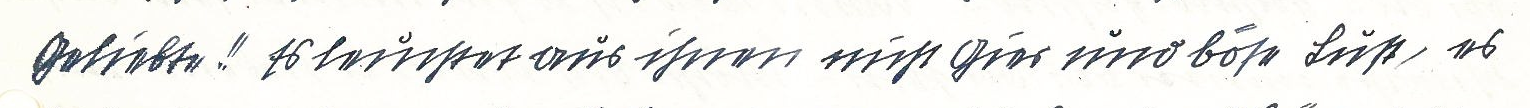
Geliebte!! Es leuchtet aus ihnen nicht Gier und böse Lust, es
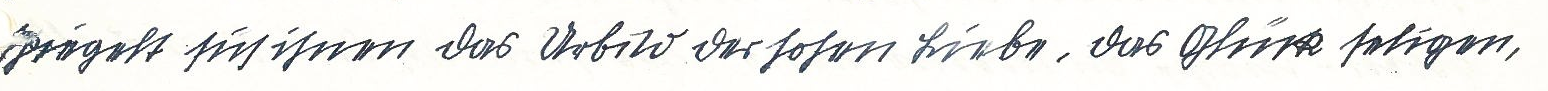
piegelt sich in ihnen das Vorbild der hohen Liebe, das Glück seligen,
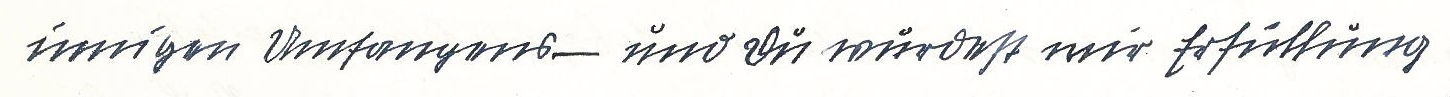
innigen Umfangens – und Du wurdest mir Erfüllung
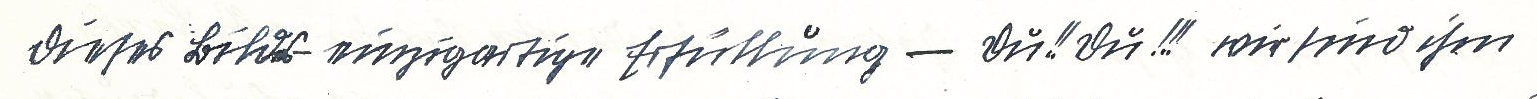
dieses Bilds – einzigartige Erfüllung – Du!! Du!!! Wir sind ihm
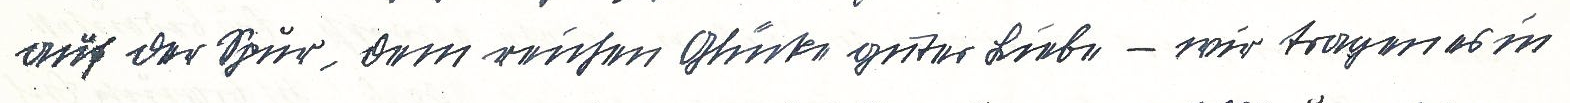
auf der Spur, dem reichen Glücke guter Liebe – wir tragen es in
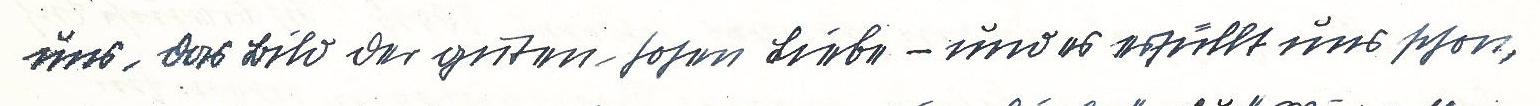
uns, das Bild der guten, hohen Liebe – und es erfüllt uns schon,
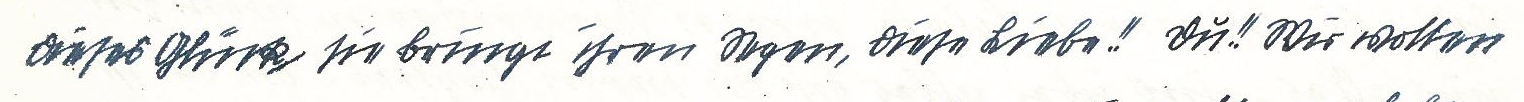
dieses Glück, sie bringt ihren Segen, diese Liebe!! Du!! Wir wollen
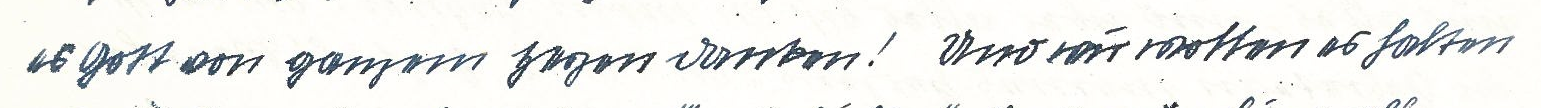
es Gott von ganzem Herzen danken! Und wir wollen es halten
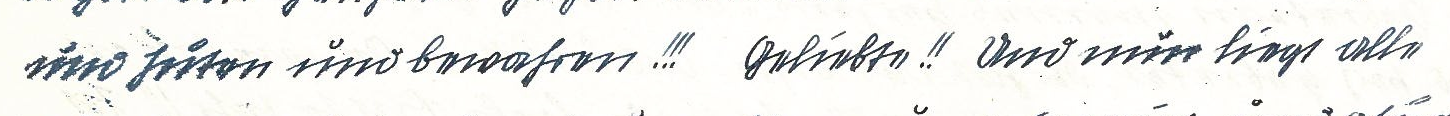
und hüten und bewahren!!! Geliebte!! Und nun liegt alle
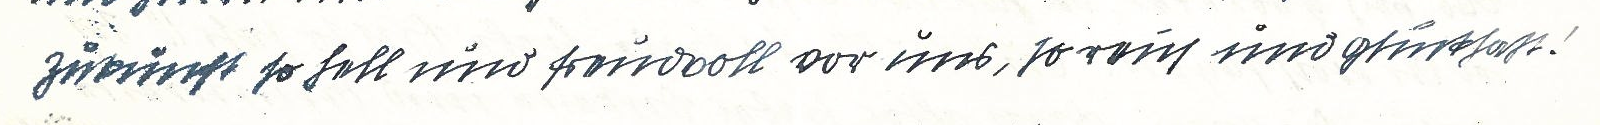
Zukunft so hell und freudvoll vor uns, so reich und glückhaft!
